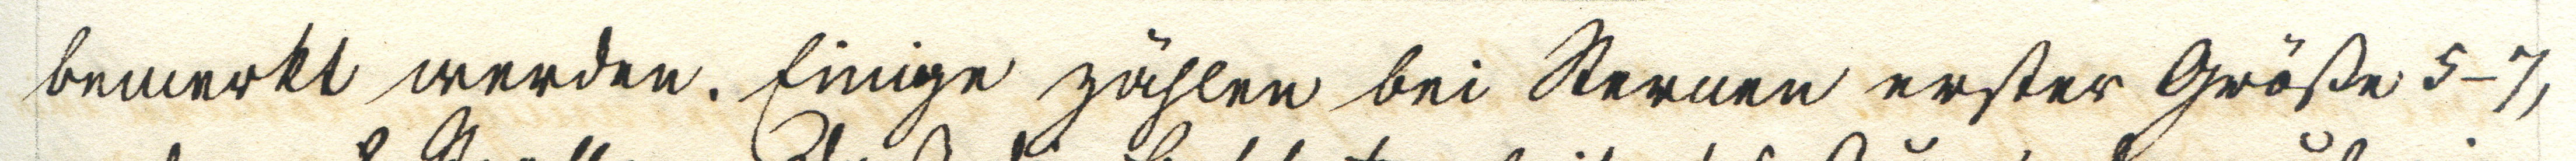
bemerkt werden. Einige zählen bei Sternen erster Größe 5–7,
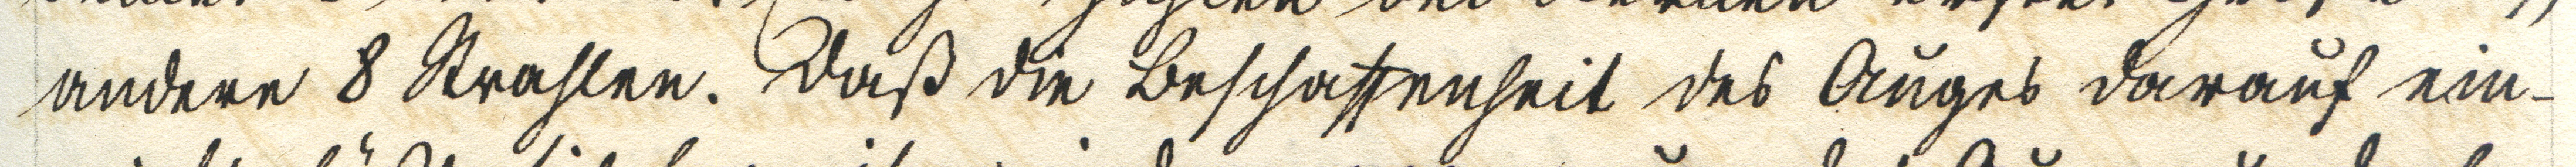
andere 8 Strahlen. Daß die Beschaffenheit des Auges darauf ein-
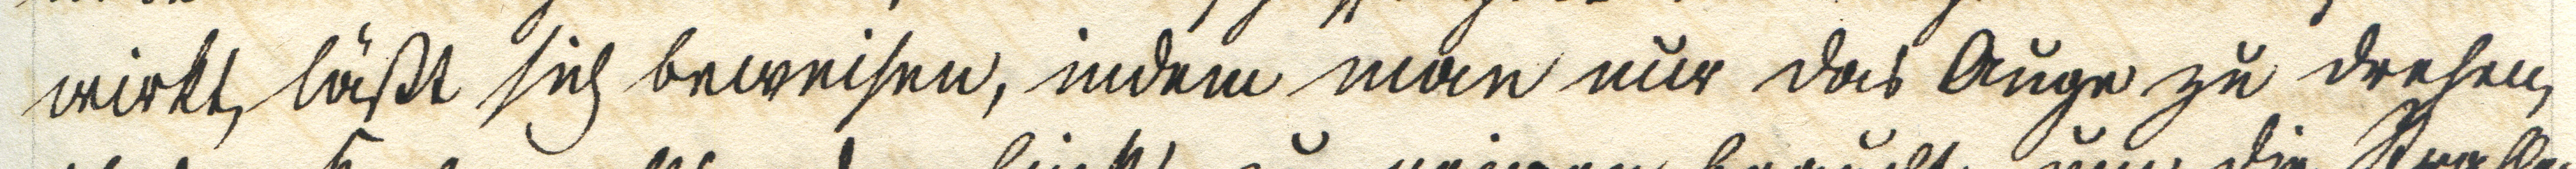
wirkt, läßt sich beweisen, indem man nur das Auge zu drehen,
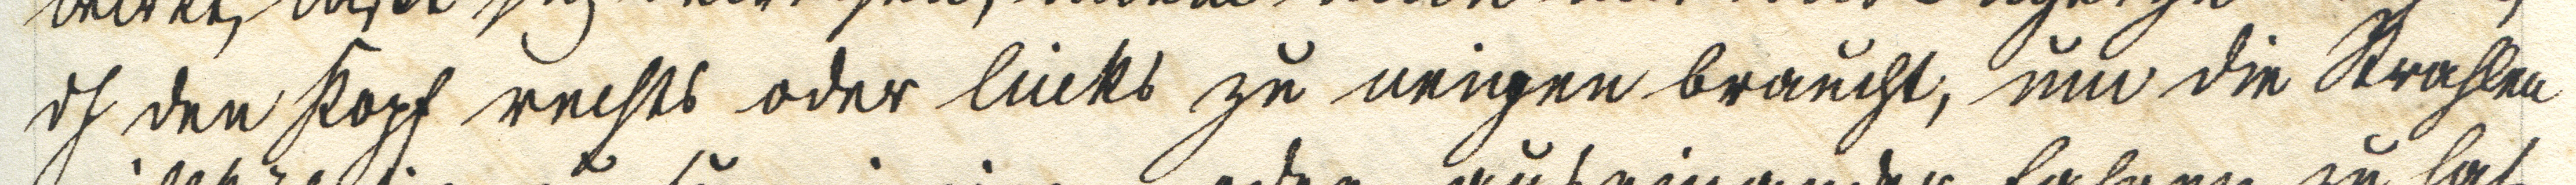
dh den Kopf rechts oder links zu neigen braucht, um die Strahlen
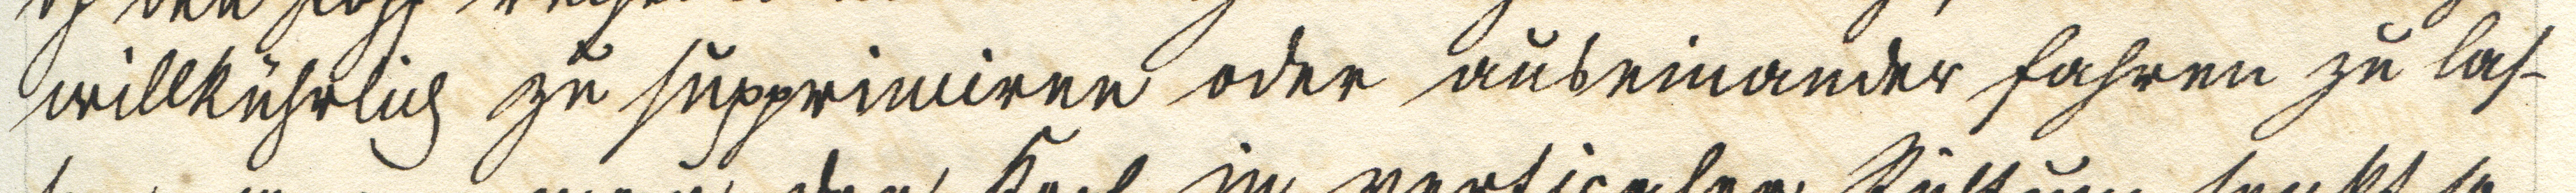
willkührlich zu supprimiren oder auseinander fahren zu las-
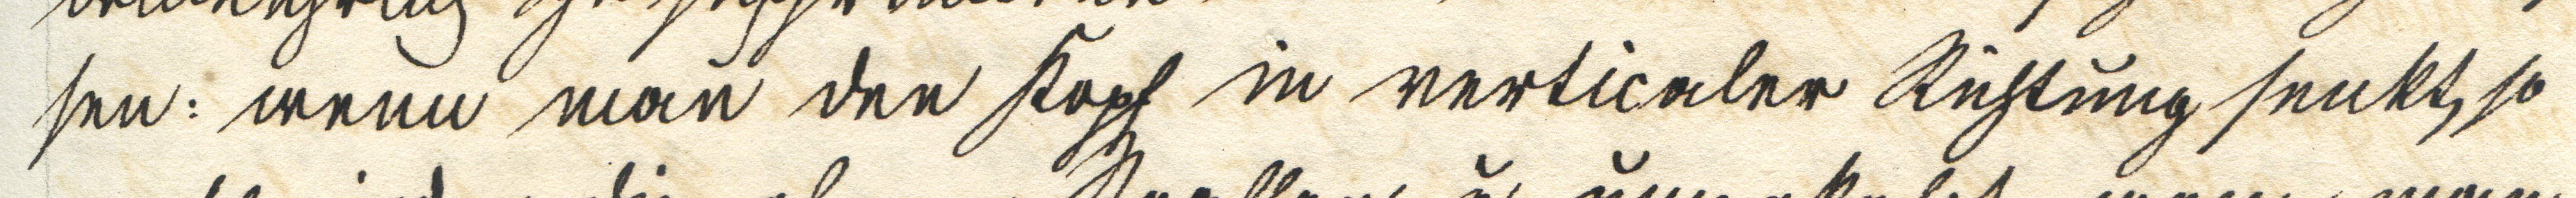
sen: wenn man den Kopf in verticaler Richtung senkt, so
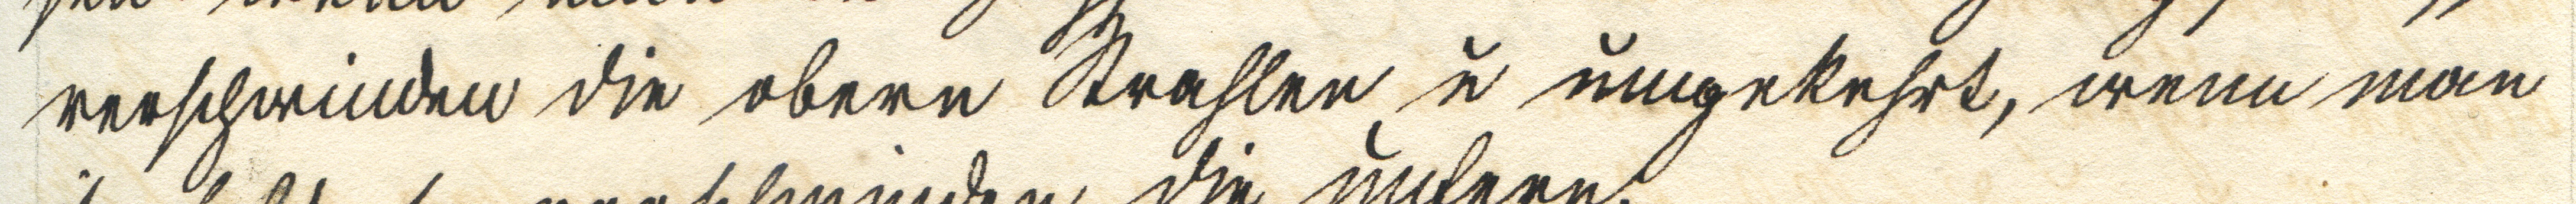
verschwinden die obern Strahlen u umgekehrt, wenn man
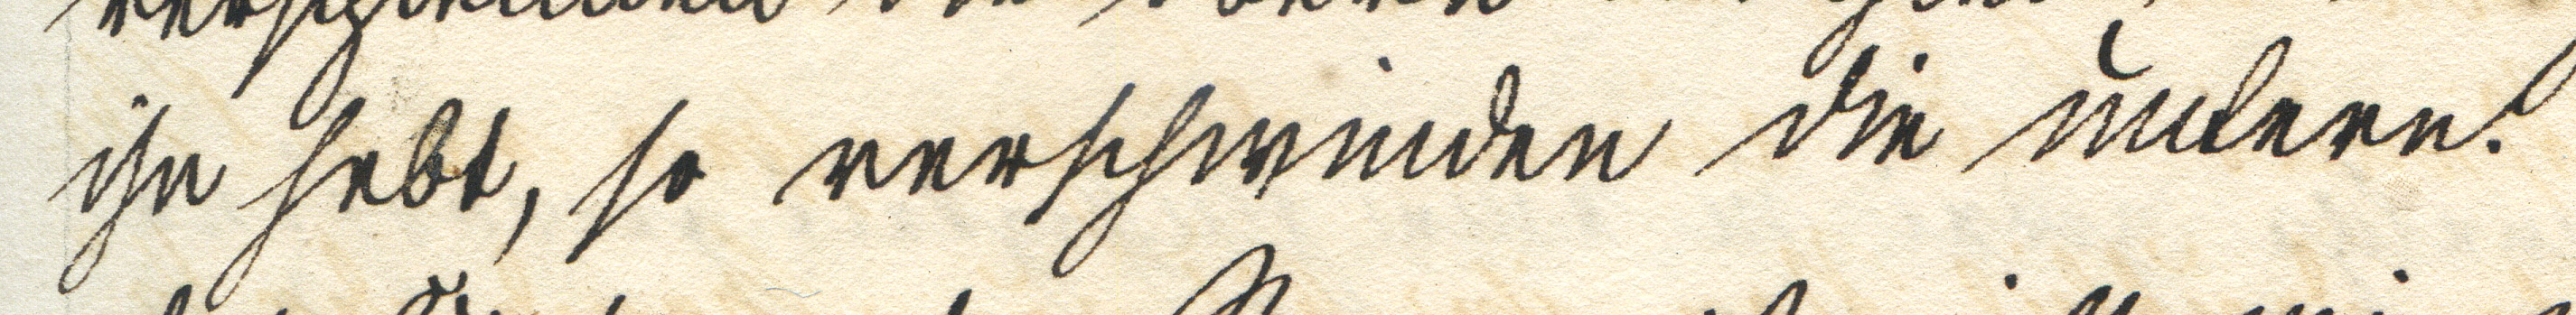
ihn hebt, so verschwinden die untern.
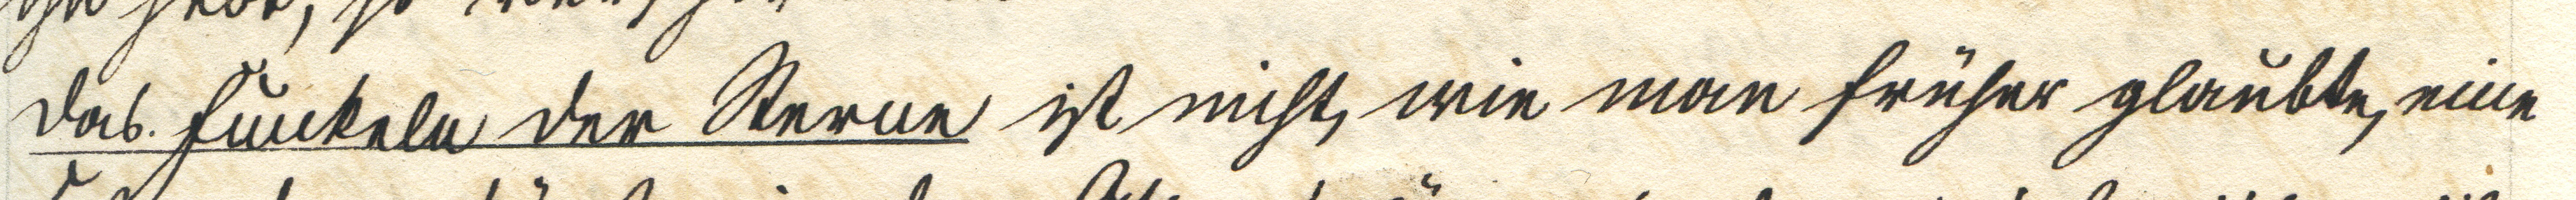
Das Funkeln der Sterne ist nicht, wie man früher glaubte, eine
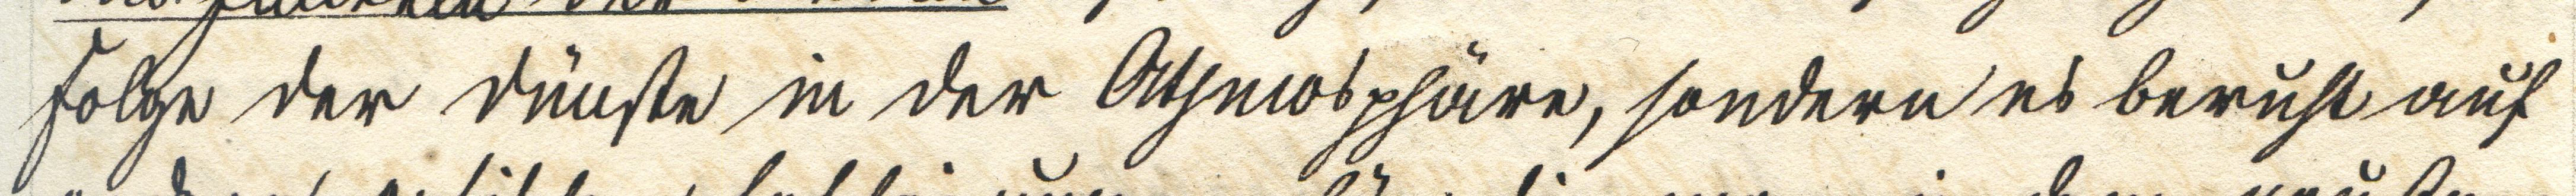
Folge der Dünste in der Athmosphäre, sondern es beruht auf
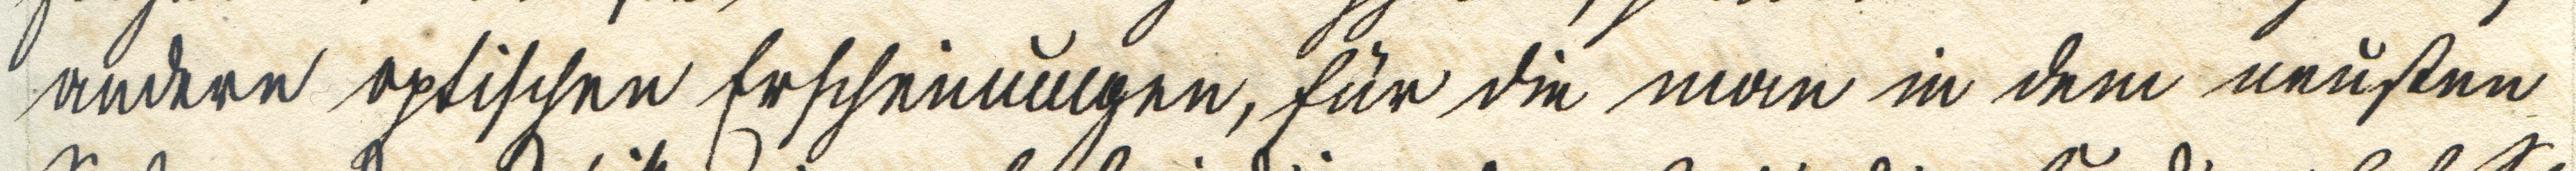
andern optischen Erscheinungen, für die man in dem neusten
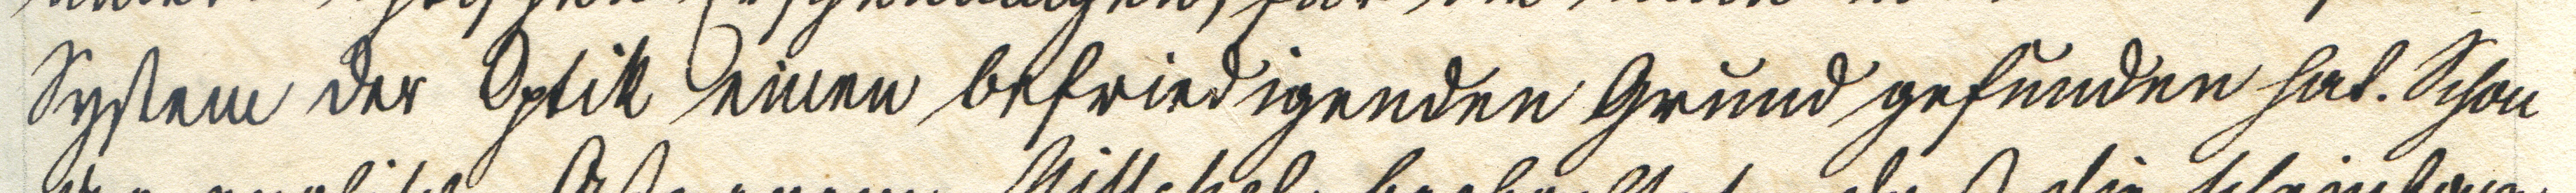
System der Optik einen befriedigenden Grund gefunden hat. Schon
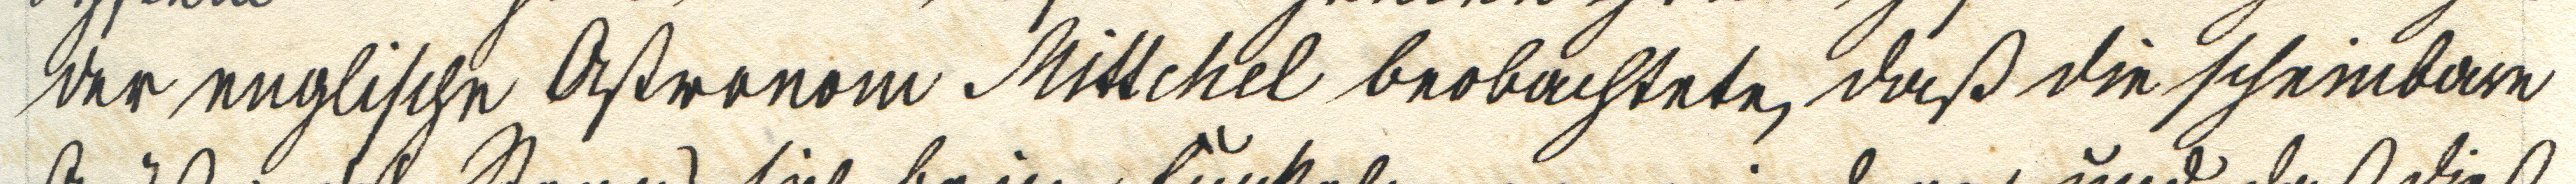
der englische Astronom Mitchell beobachtete, daß die scheinbare
